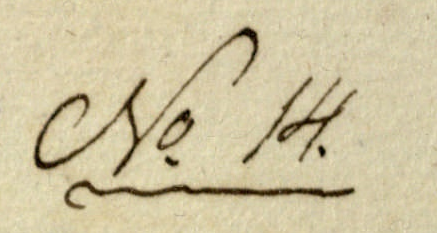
No 14.
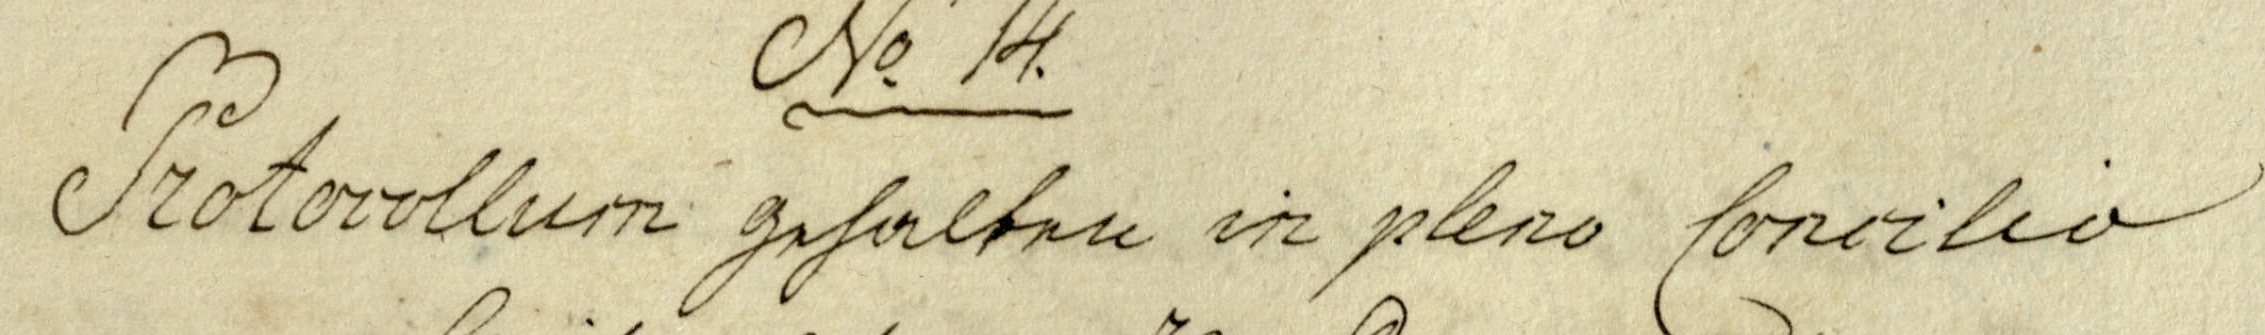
Protocollum gehalten in pleno Concilio
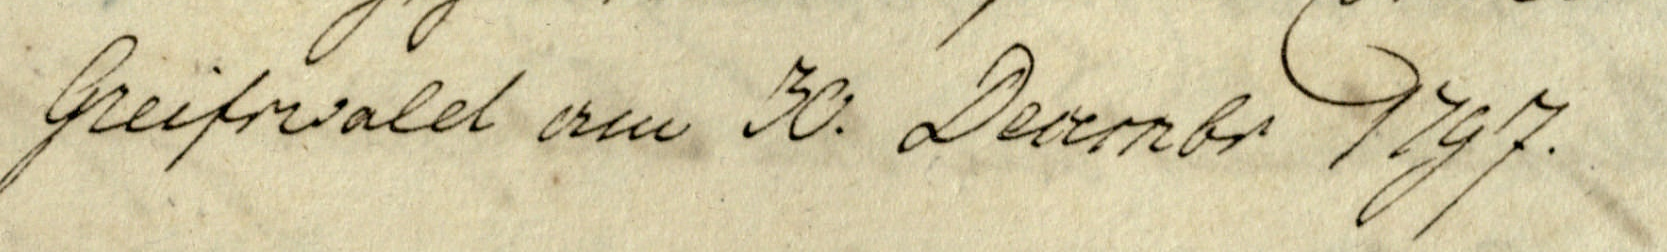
Greifswald am 30. Decembr 179 7.
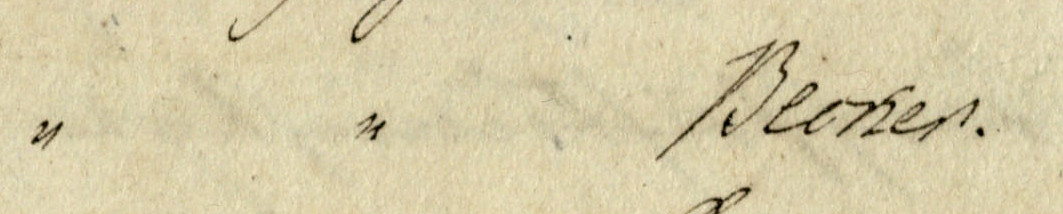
Becker.
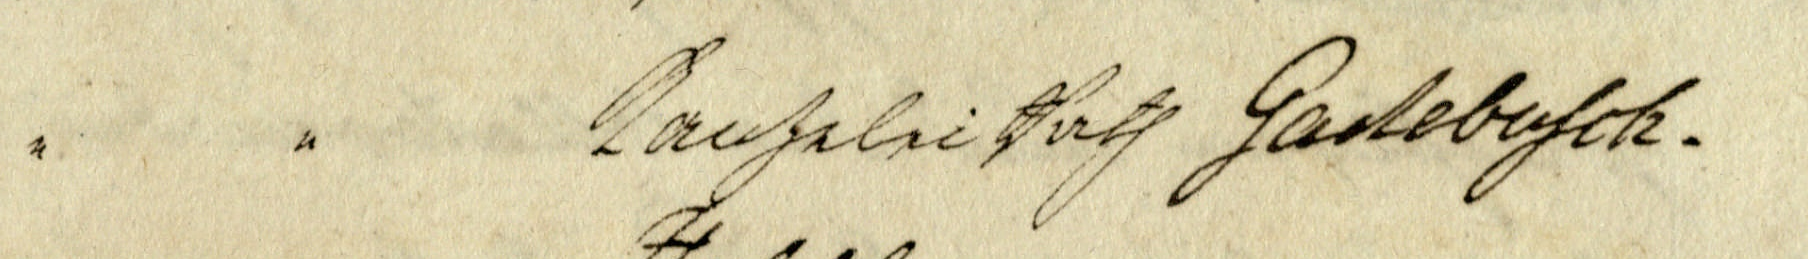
Kanzelei Rath Gadebusch.
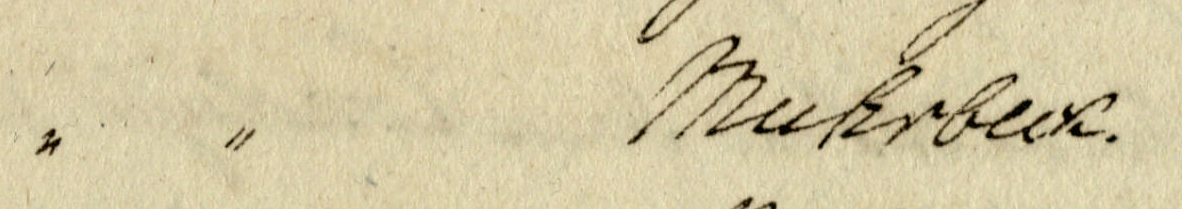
Muhrbeck.
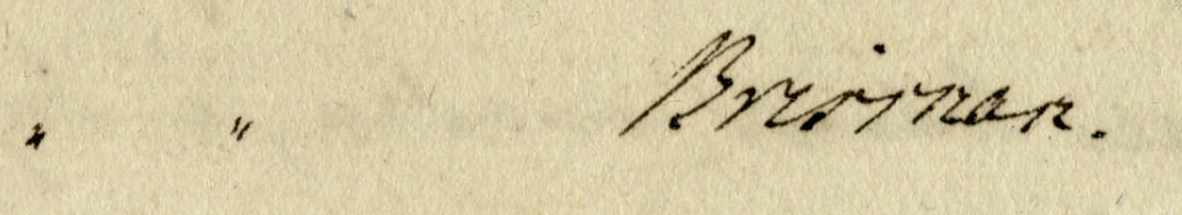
Brisman.
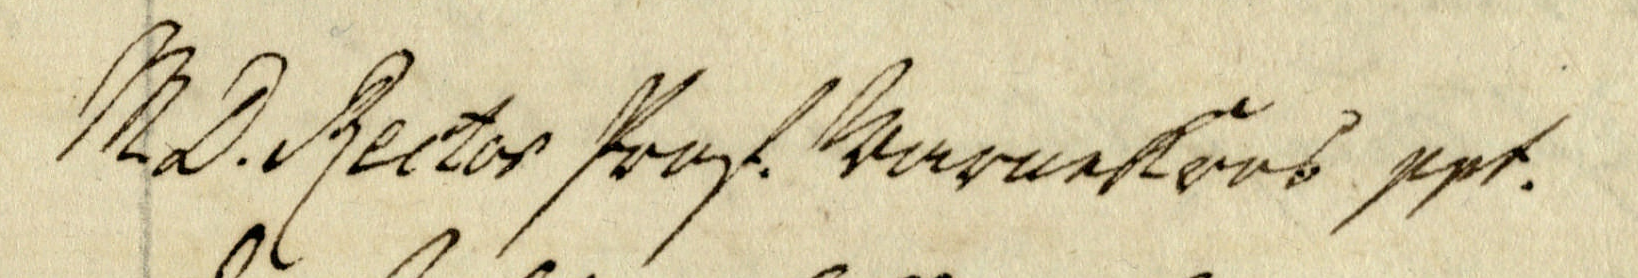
M D. Rector Prof. Warnekros ppt.
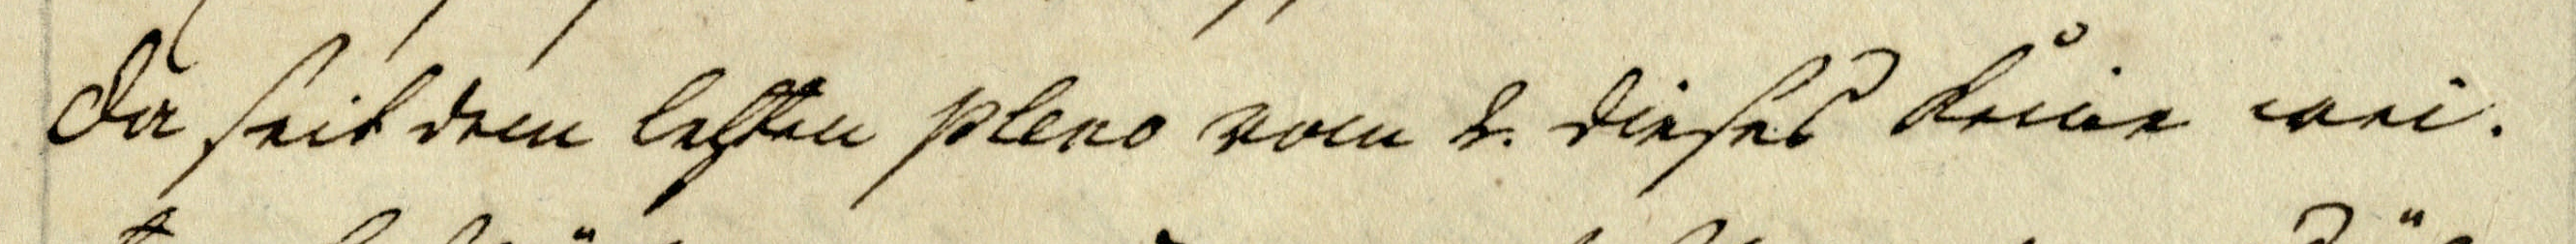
Da seit dem letzten pleno vom 2. dieses keine wei¬
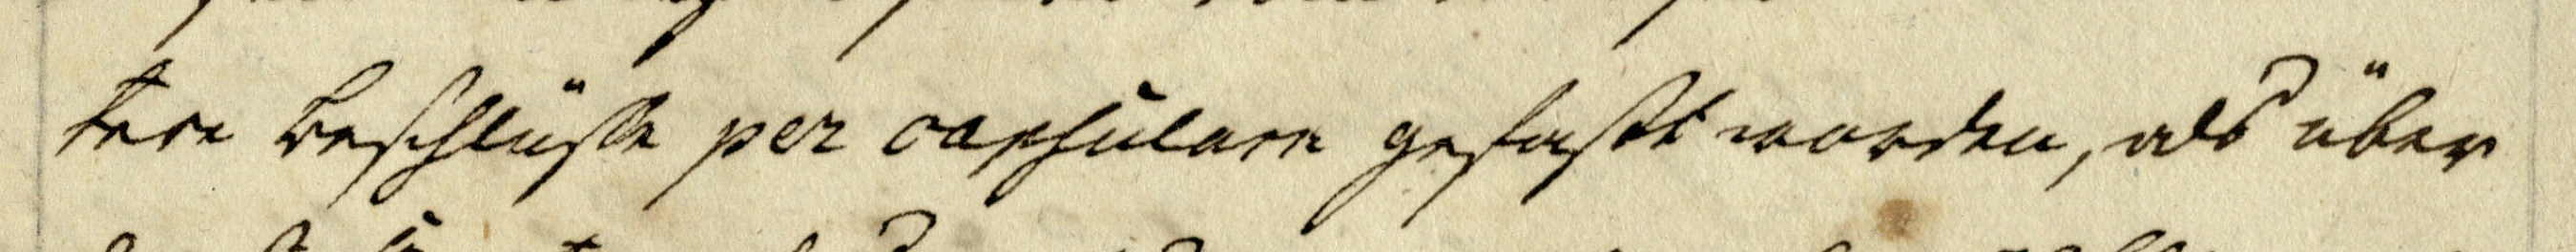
tere Beschlüssen per capsulam gefaßt worden, als über
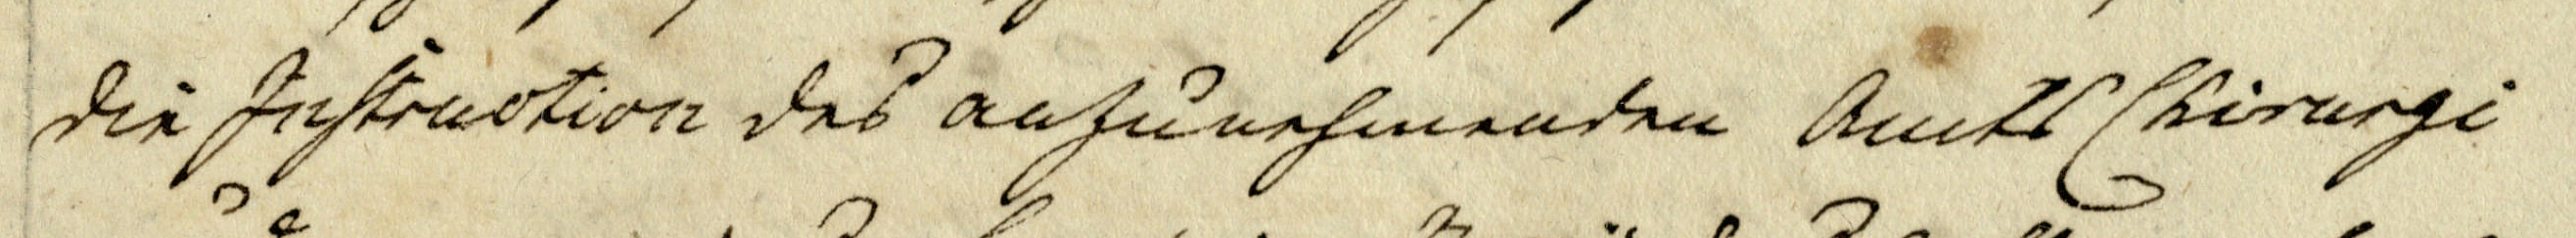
die Instruction des anzunehmenden Amts Chirurgi
